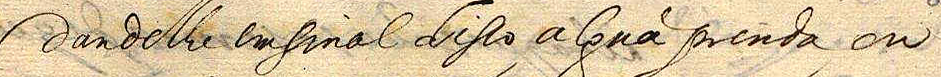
dandolhe em sinal disso, alguā prenda, ou
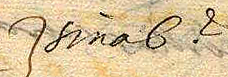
sinal?
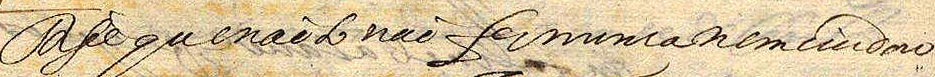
Disse que naõ so naõ fez nunca nem cuidou
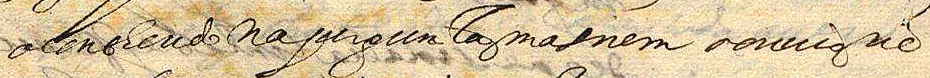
o contheudo na pergunta, mas nem o ouuio, nē
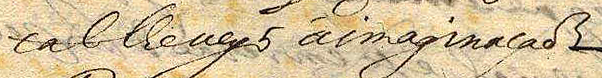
tal lhe ueyo a imaginaçaõ
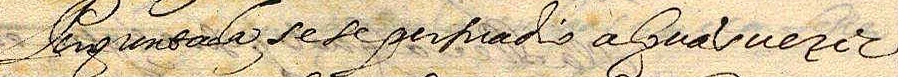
Perguntada, se se persuadio alguas̄ uezes
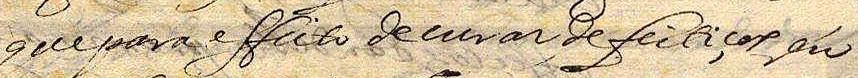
que para effeito de curar de feitiços, ou
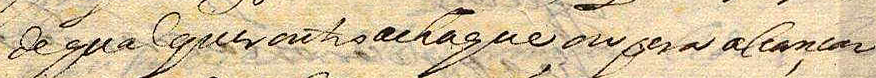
de qualquer outro achaque ou pera alcançar
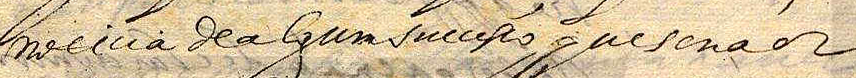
noticia de algum successo, que se naõ
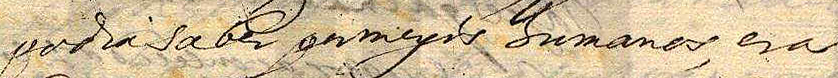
podia saber por meyos humanos, era
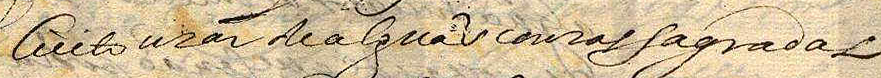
licito uzar de alguas̄ couzas sagradas
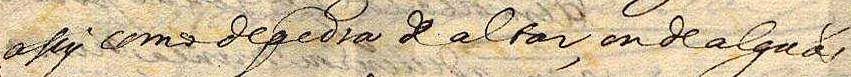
assy como de pedra de altar, ou de alguās
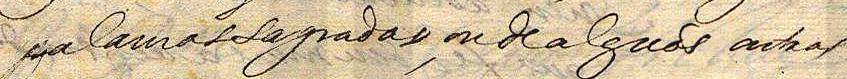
palauras sagradas, ou de alguas̄ outras
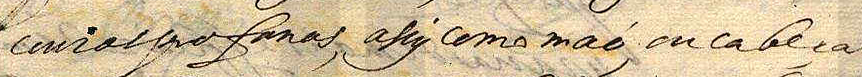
couzas profanas, assy como maõ, ou cabeça
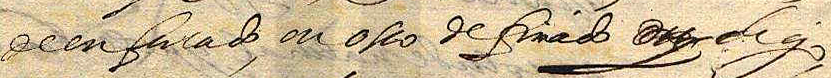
de enforcado, ou osso de finado ou digo,
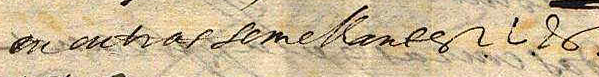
ou outras semelhantes?
